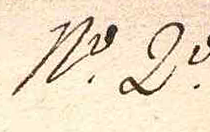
n.o 2.o
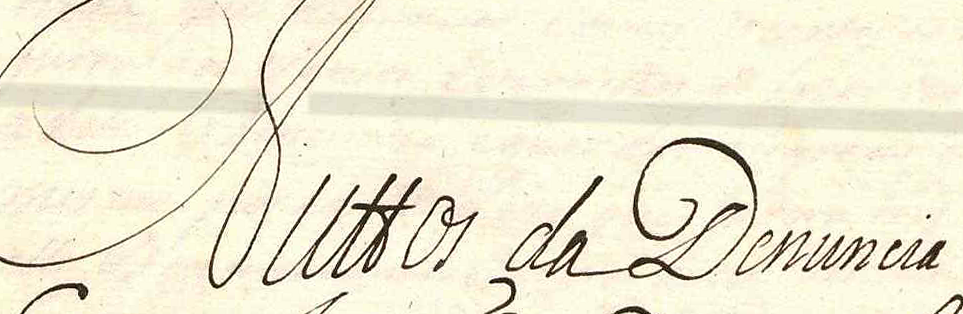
Auttos da Denuncia
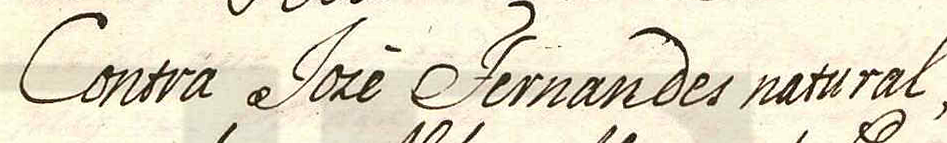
Contra Iozé Fernandes natural,
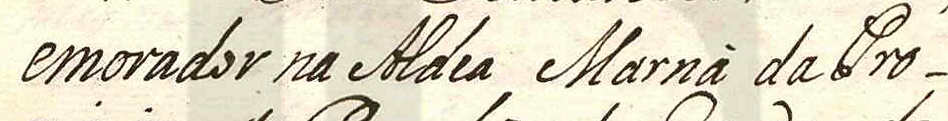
e morador na Aldea Marnà da Pro
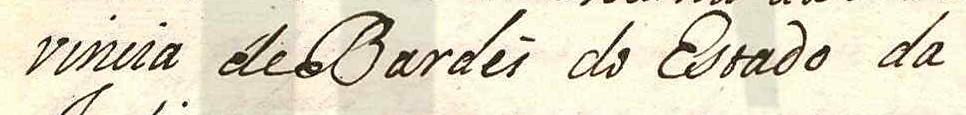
vincia de Bardás do Estado da
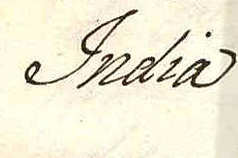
India
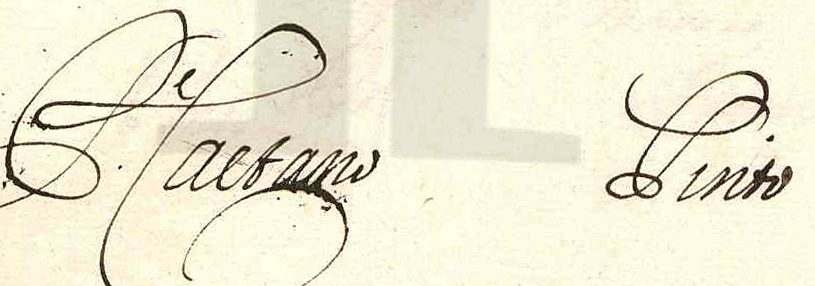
P.e Caetano Pinto
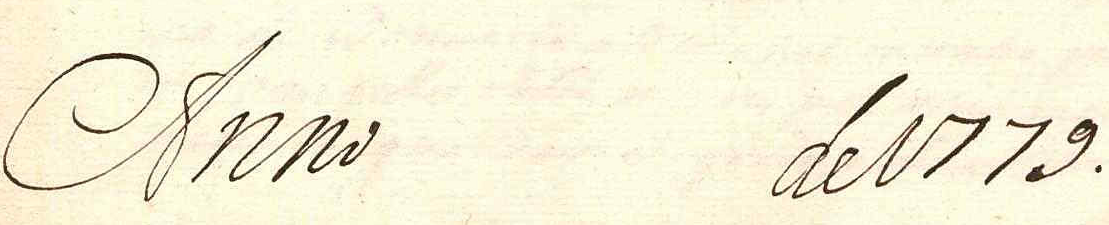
Anno de 1779.
